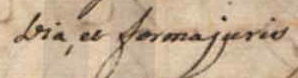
via, et forma juris
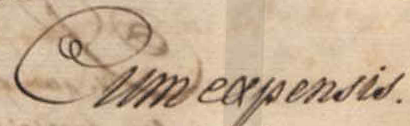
Cum expensis.
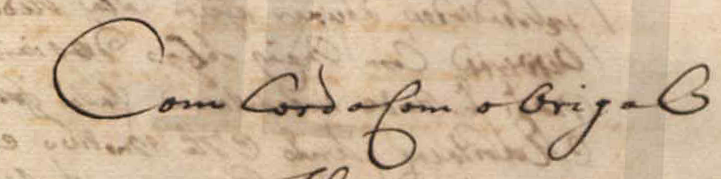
ComCorda Com obrigaC
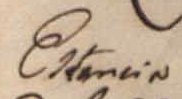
Estancia
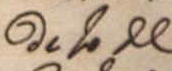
de 20 de
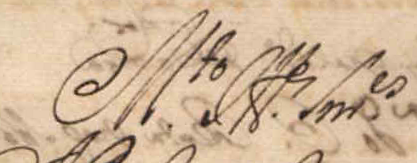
M.to Ill.es Snr.es
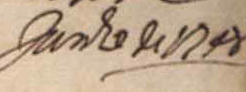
Junho de 1748
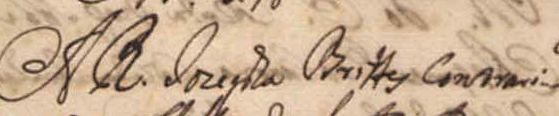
A R. Iozepha Brittes Contrari.
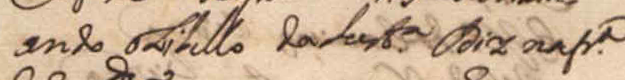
ando o Libello da Iust.a Diz na fr.a
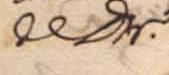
de Dr.o
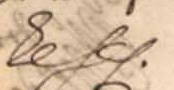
he feC.
